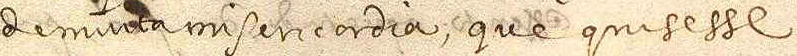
de muita misericordia, que quisesse
